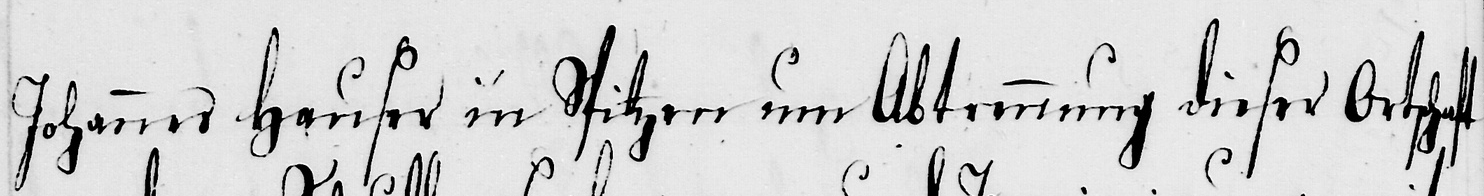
Johannes Hauser in Spitzen um Abtrennung dieser Ortsch¬
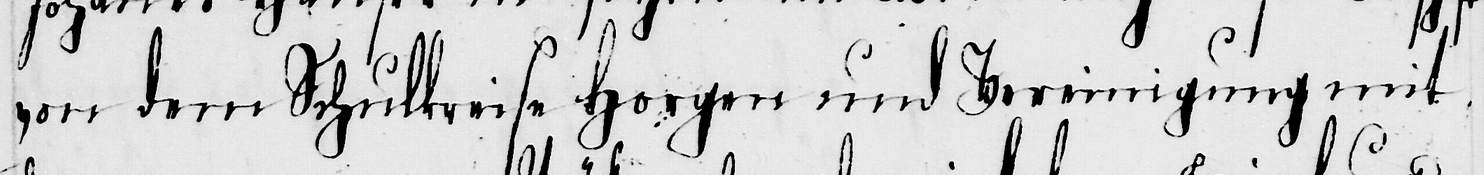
von dem Schulkreise Horgen und Vereinigung mit
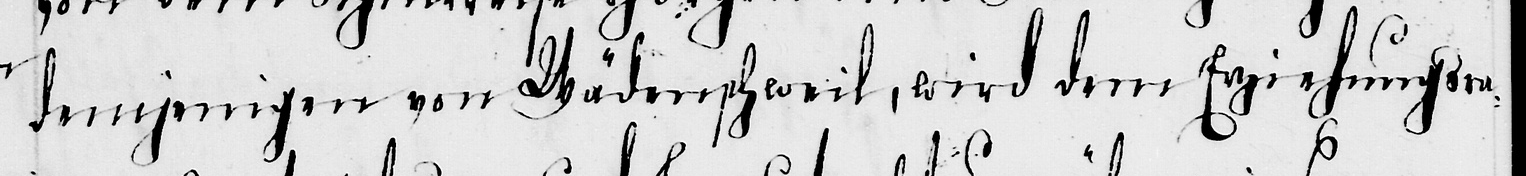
demjenigen von Wädenschweil, wird dem Erziehungsra¬
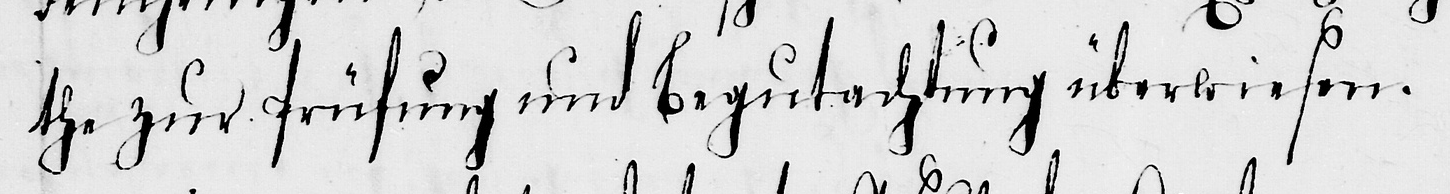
the zur Prüfung und Begutachtung überwiesen.
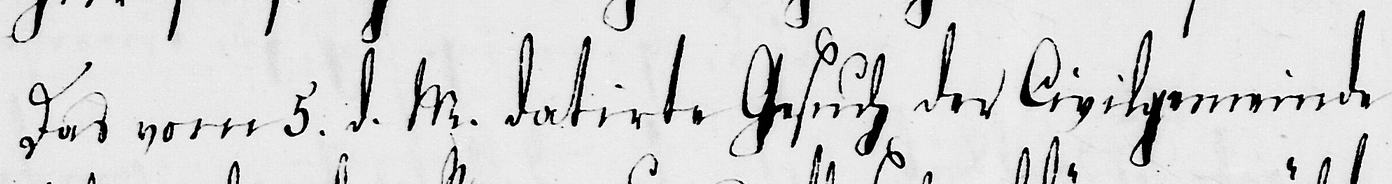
Das vom 5. d. M. datirte Gesuch der Civilgemeinde
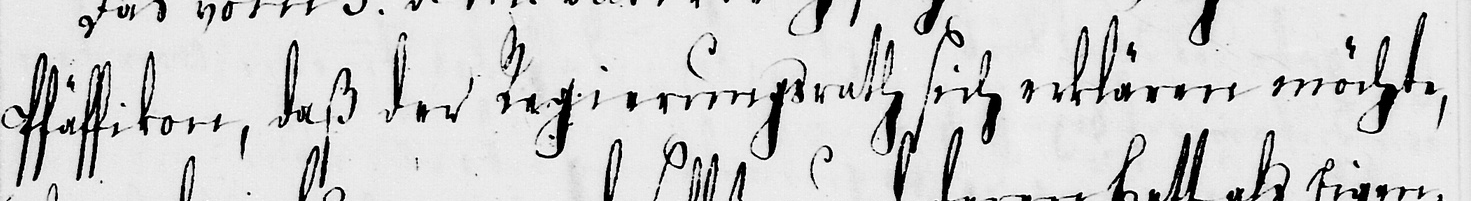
Pfäffikon, daß der Regierungsrath sich erklären möchte,
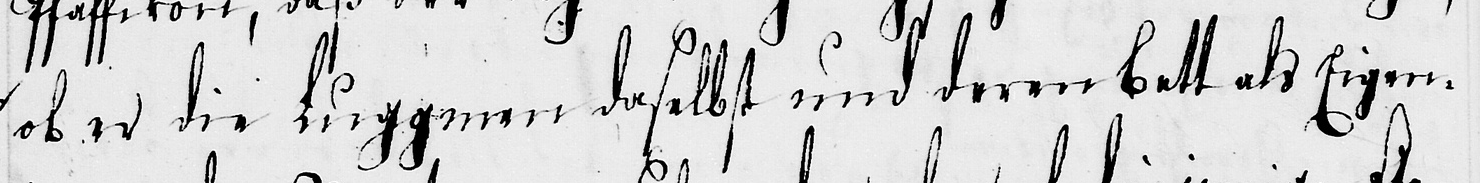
ob er die Luggmen daselbst und deren Bett als Eigen¬
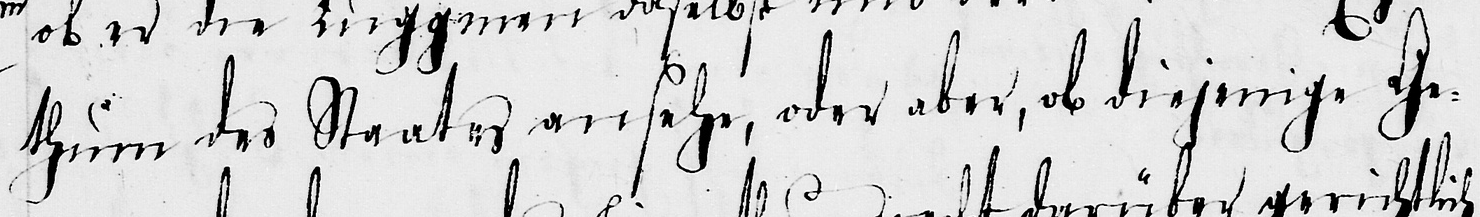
thum des Staates ansehe, oder aber, ob diejenige Ge¬
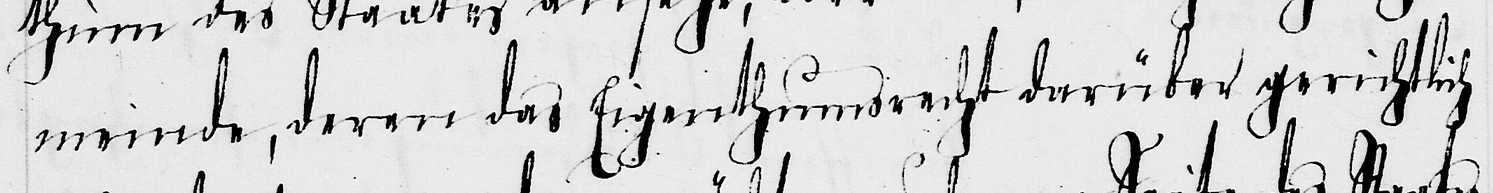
meinde, deren das Eigenthumsrecht darüber gerichtlich
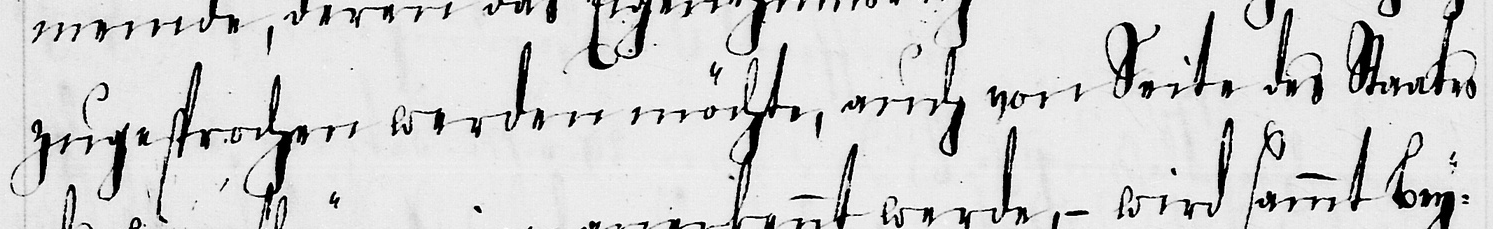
zugesprochen werden möchte, auch von Seite des Staates
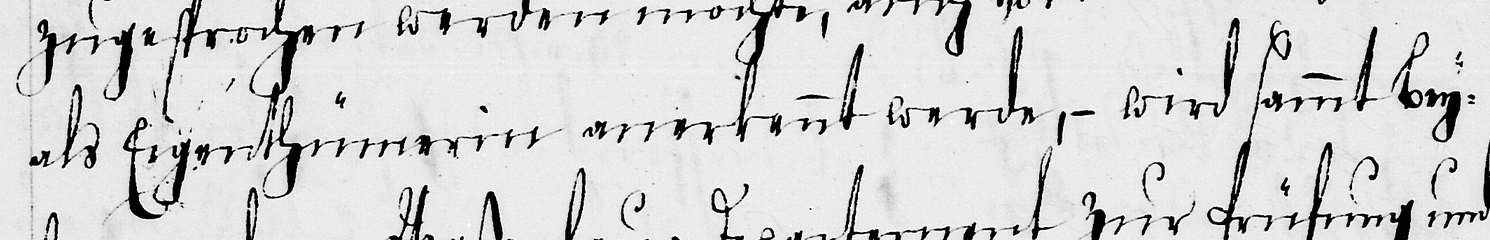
als Eigenthümerin anerkennt werde, – wird sammt Bey¬
